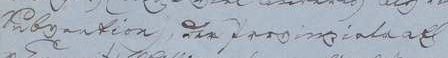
Subvention), der Provinzialrath
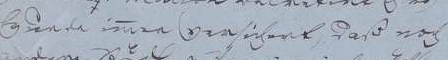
wurde immer versichert, daß noch
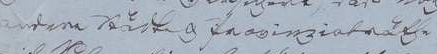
andere Städte & Provinzialräthe
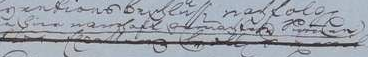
werden. Ewr Excellenz wollen
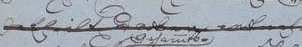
getheilten Daten entnehmen,
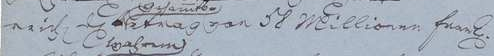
reichen den BGesammtb-etrag von 58 Millionen Franken.
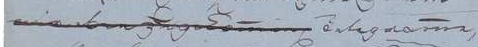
mir eben zugekommenen Telegramme, von Ewr Excellenz welches
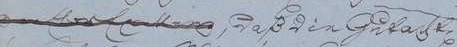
Sie mir so eben zukommen zu lassen die Güte hatten,
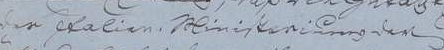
des Italien. Ministeriums der
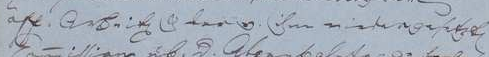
öff. Arbeiten & der v. ihm niedergesetzten
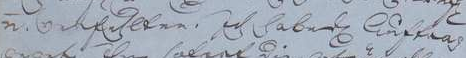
n. verfehlten. Ich habe den Auftrag
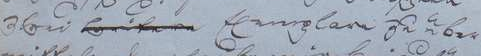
zwei weitern Exemplare zu über-
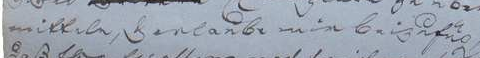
mitteln, & erlaube mir beizufügen,
